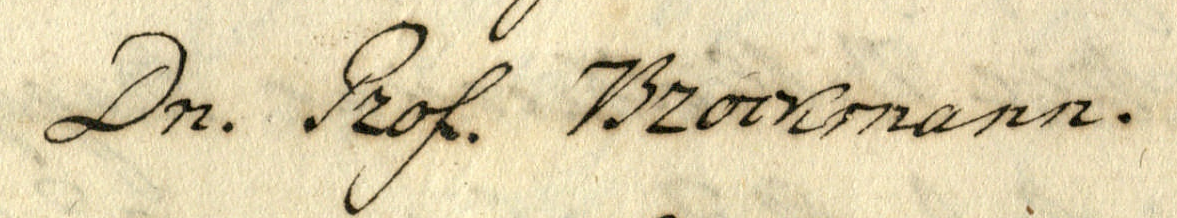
Dn. Prof. Brockmann.
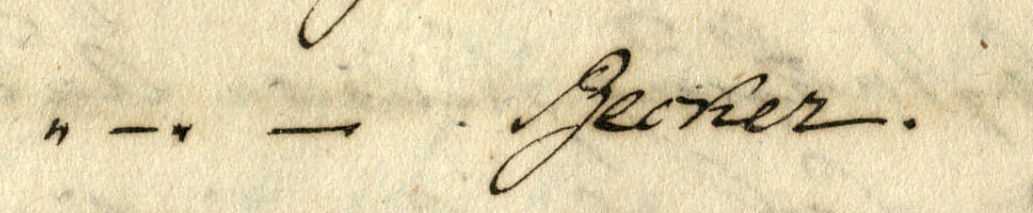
" - " - . Becker.
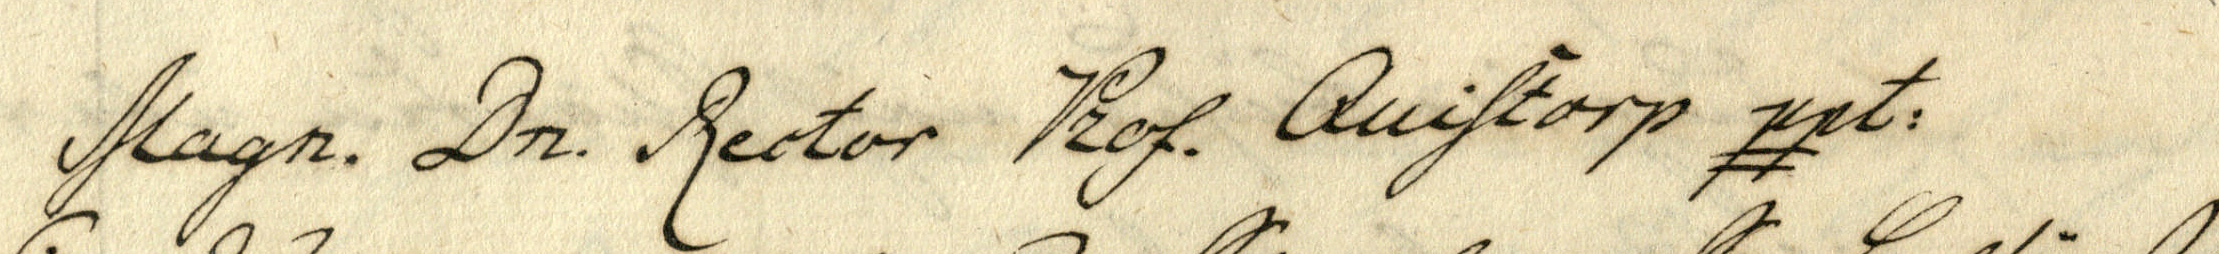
Magn. Dn. Rector Prof. Quistorp ppt:
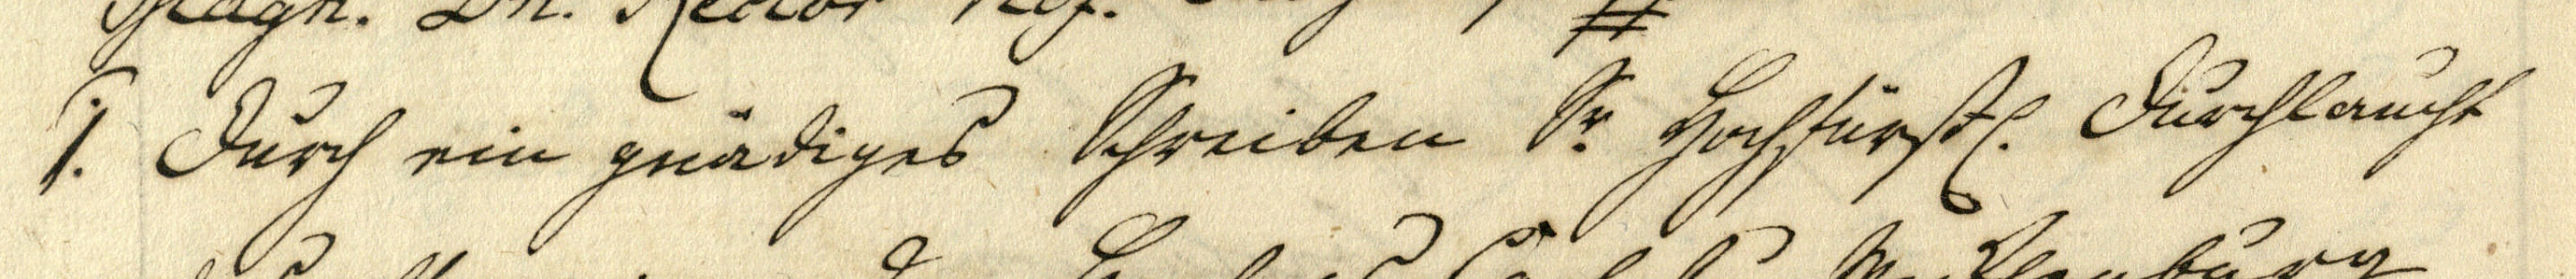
1. Durch ein gnädiges Schreiben Sr. Hochfürstl. Durchlaucht
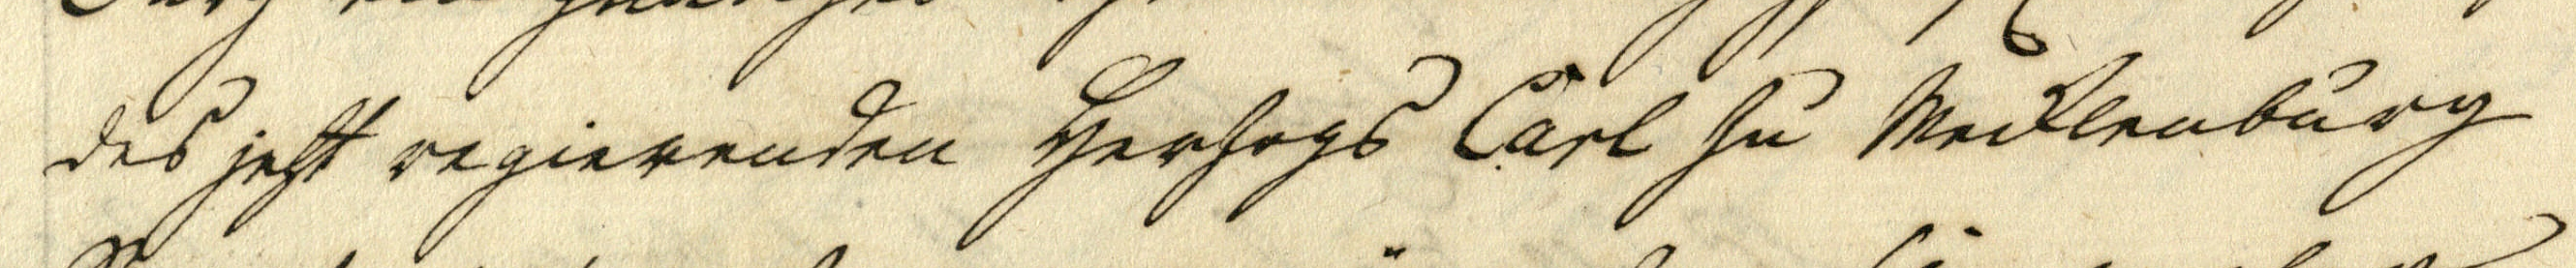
des jetzt regierenden Herzogs Carl zu Mecklenburg
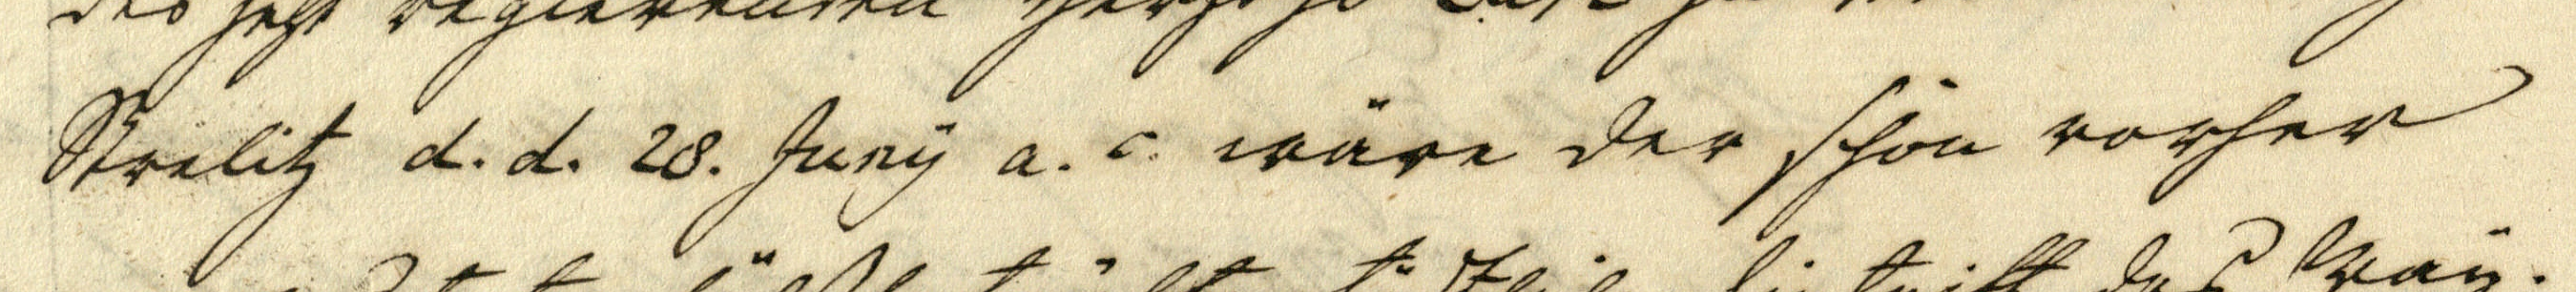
Strelitz d. d. 28. Juny a. c. wäre der schon vorher
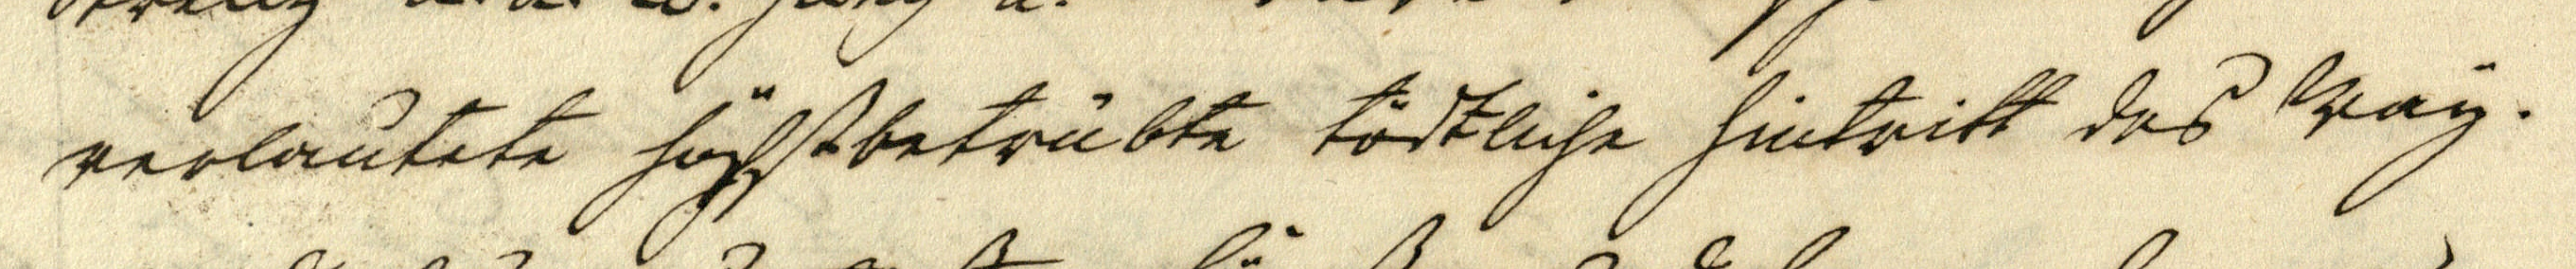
verlautete höchstbetrübte tödtliche Hintritt des Wey-
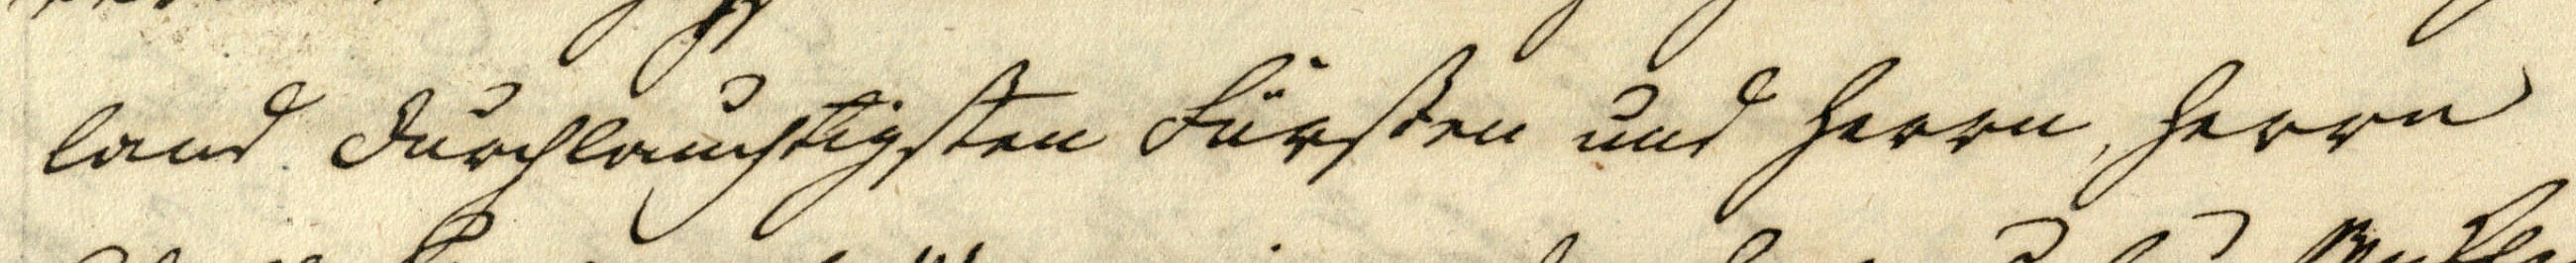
land durchlauchtigsten Fürsten und Herrn, Herrn
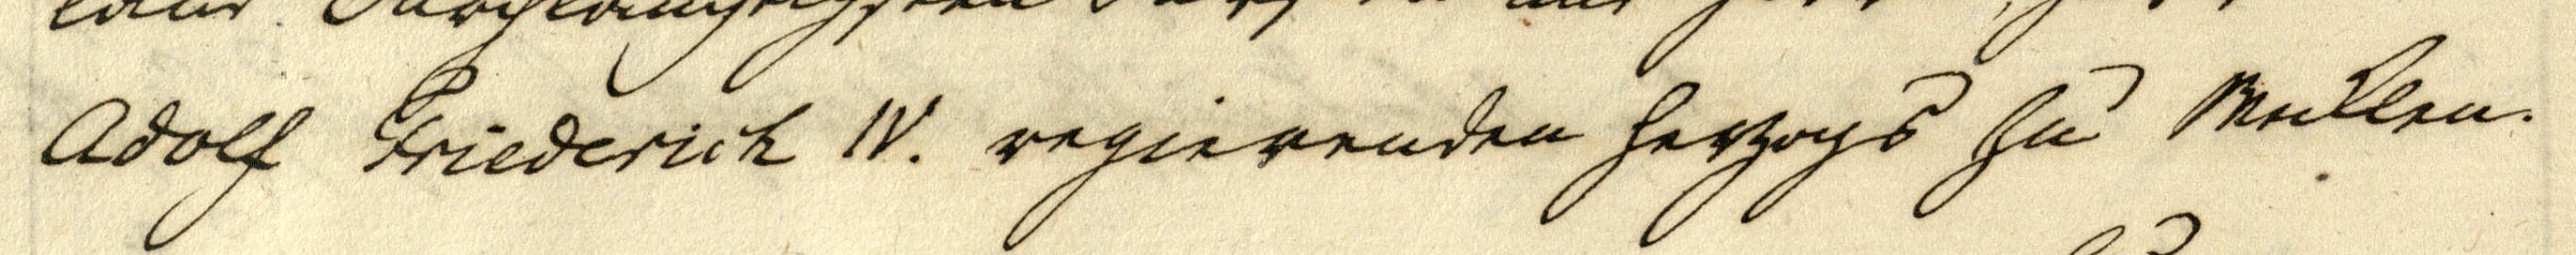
Adolf Friederich IV. regierenden herzogs zu Meklen-
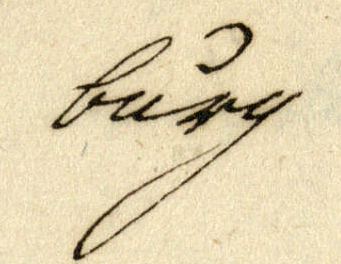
burg
